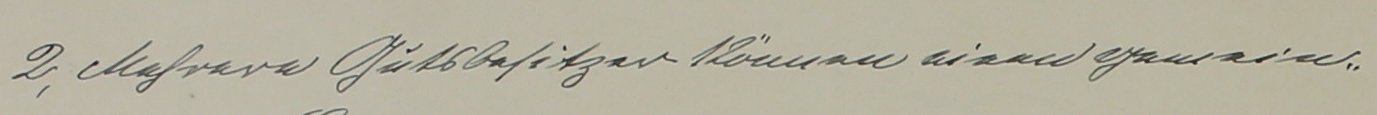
2. Mehrere Gutsbesitzer können einen gemein-
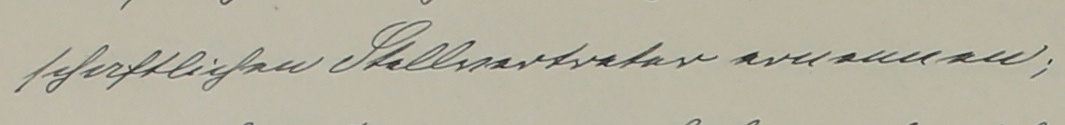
schaftlichen Stellvertreter ernennen;
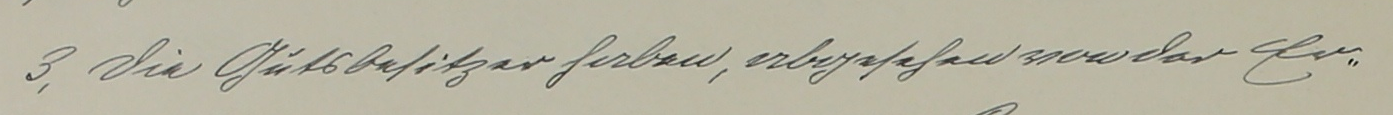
3. Die Gutsbesitzer haben, abgesehen von der Er-
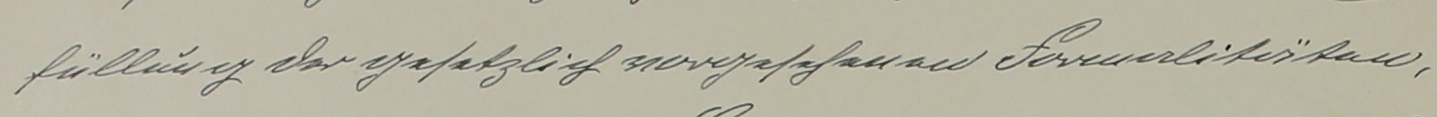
füllung der gesetzlich vorgesehenen Formalitäten,
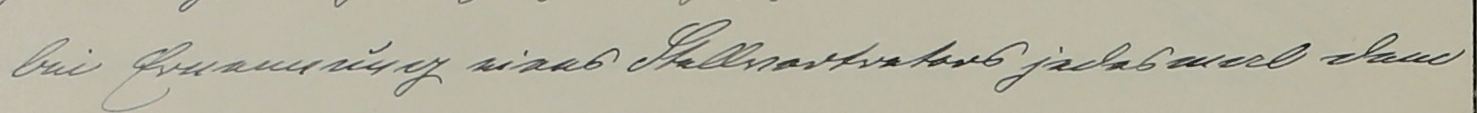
bei Ernennung eines Stellvertreters jedesmal dem
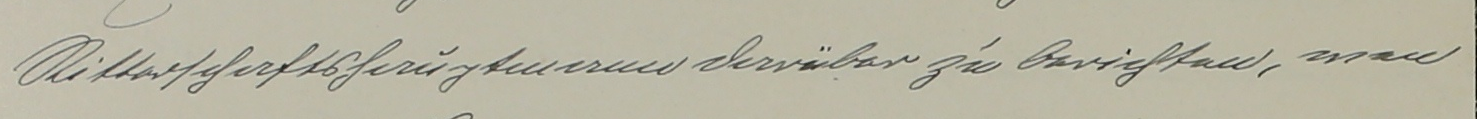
Ritterschaftshauptmann darüber zu berichten, wen
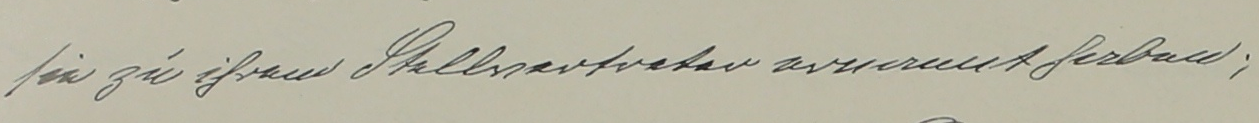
sie zu ihrem Stellvertreter ernannt haben;
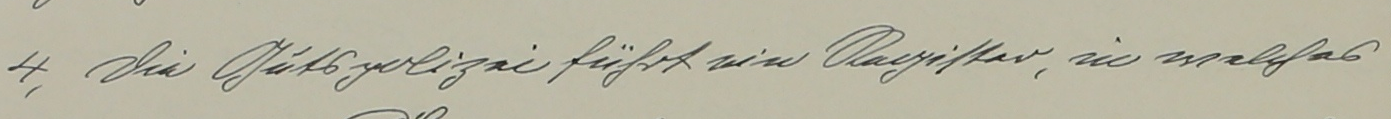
4. Die Gutspolizei führt ein Register, in welches
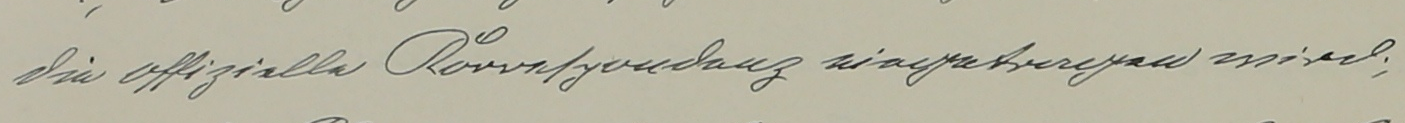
die offizielle Korrespondenz eingetragen wird;
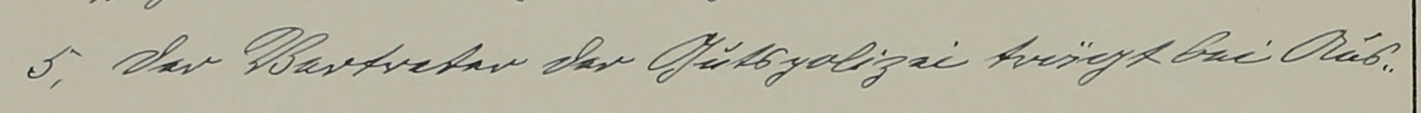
5. Der Vertreter der Gutspolizei trägt bei Aus-
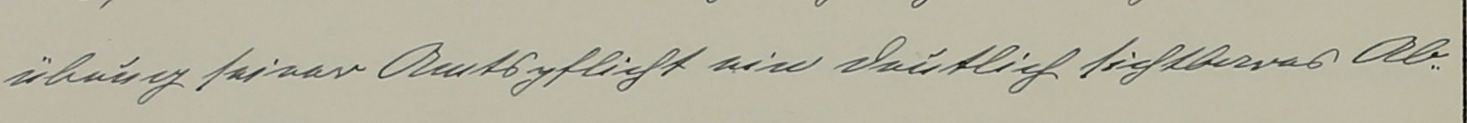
übung seiner Amtspflicht ein deutlich sichtbares Ab-
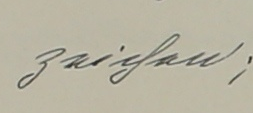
zeichen;
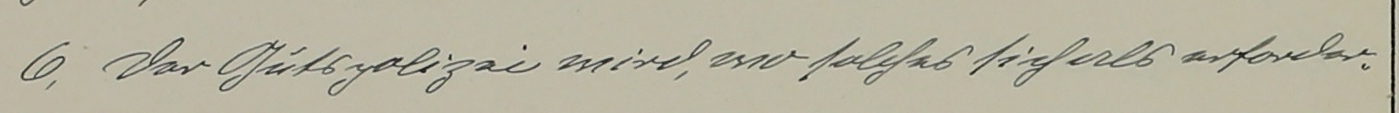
6. Der Gutspolizei wird, wo solches sich als erforder-
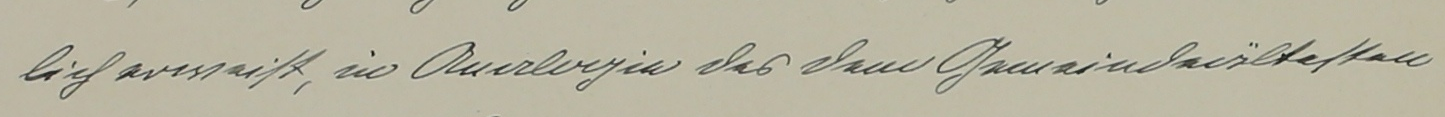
lich erweist, in Analogie des dem Gemeindeältesten
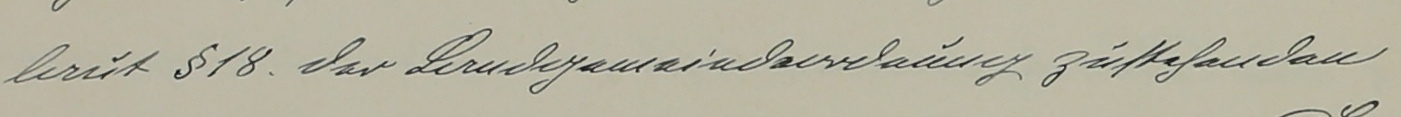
laut §18. der Landgemeindeordnung zustehenden
